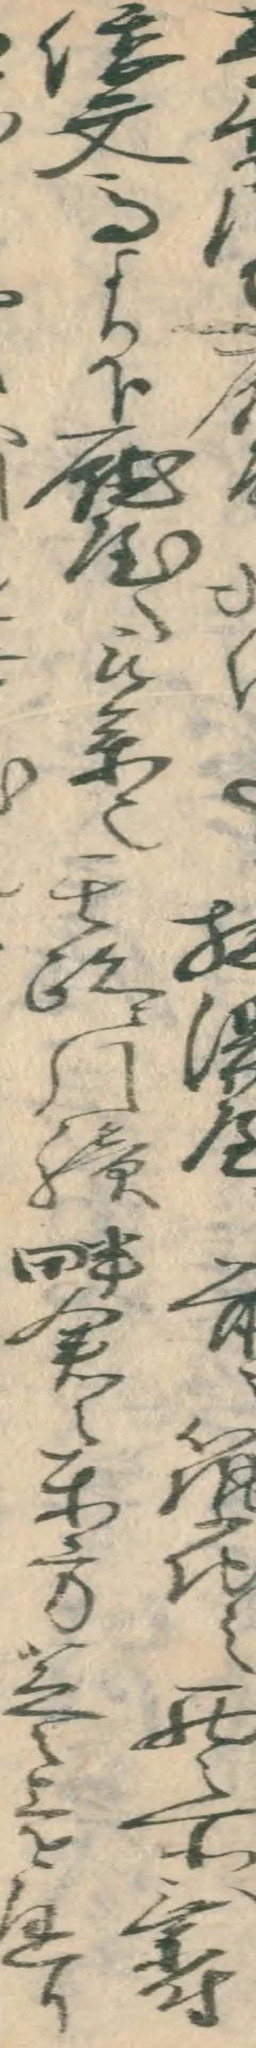倭文馬より下庁屋へ被参也其跡ニ引続畔倉之東方芝之上を通り
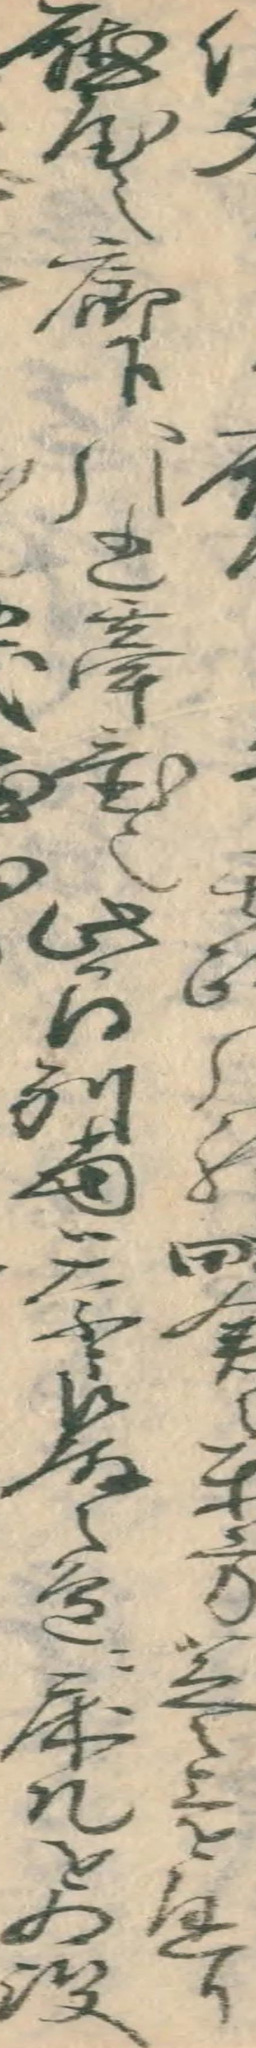庁屋之廊下へ引込牽置也此間別当ハ奈良殿之辺ニ床几を為設
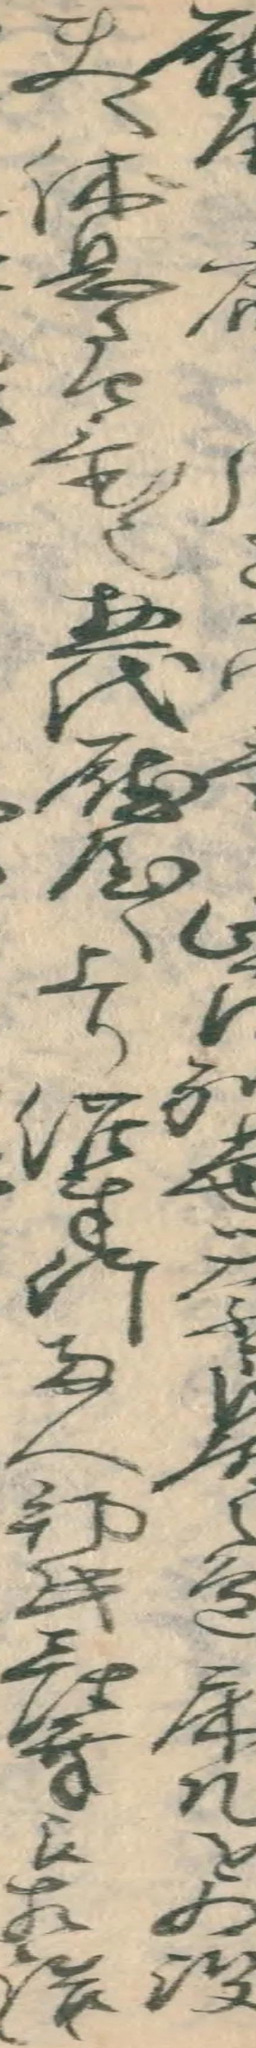夫へ休息させ置也惣代庁屋へ上り催奉行両人邦氏産幸被相詰候故
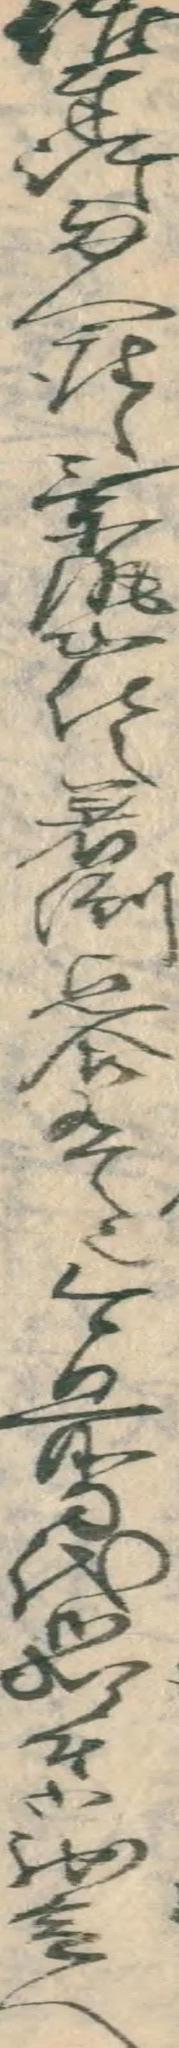催奉行両人座候乗尻出仕之着倒点合有之也今日所司代御出ニ付御馳走人
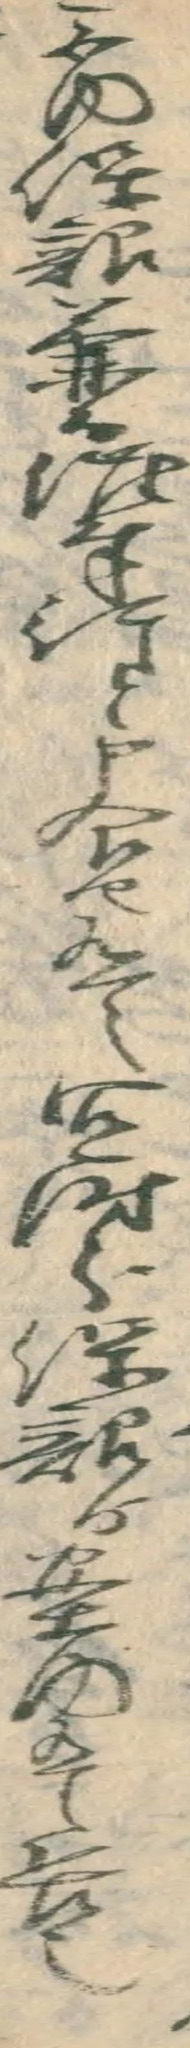宮内保韶兼而催奉行と申合せ有之宜時分保韶ゟ案内有之筈也
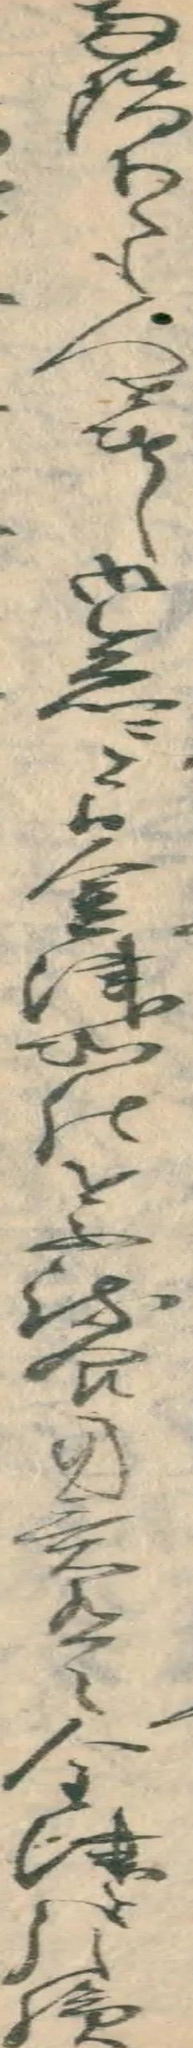両階下へも人を遣し御急ニ候間金津出仕を不待合用意有之金津と引続
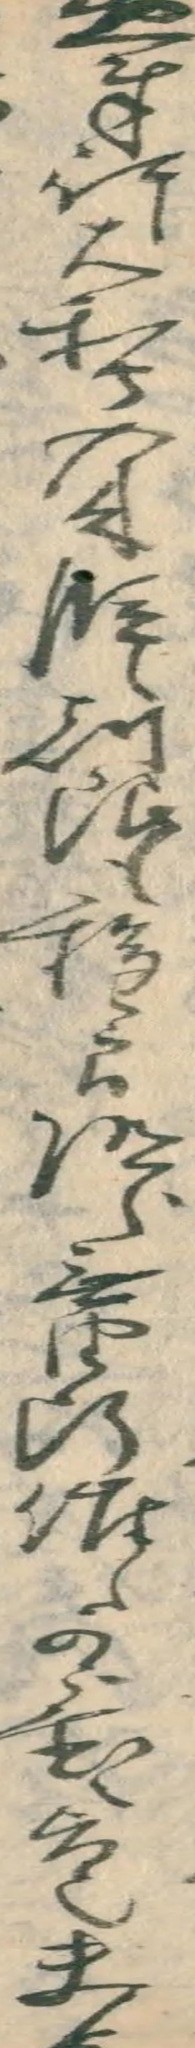惣奉行大和守入来段々刻限も移候間随分無由断催し可被置候旨也夫ゟ
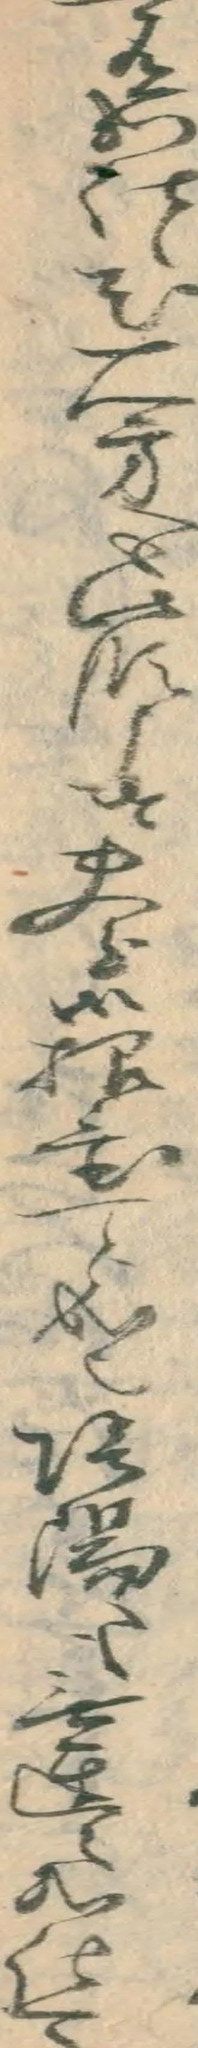可有出仕候尤右方へも此段申遣夫ゟ御招置可被成也陰陽へも無遅之出仕可

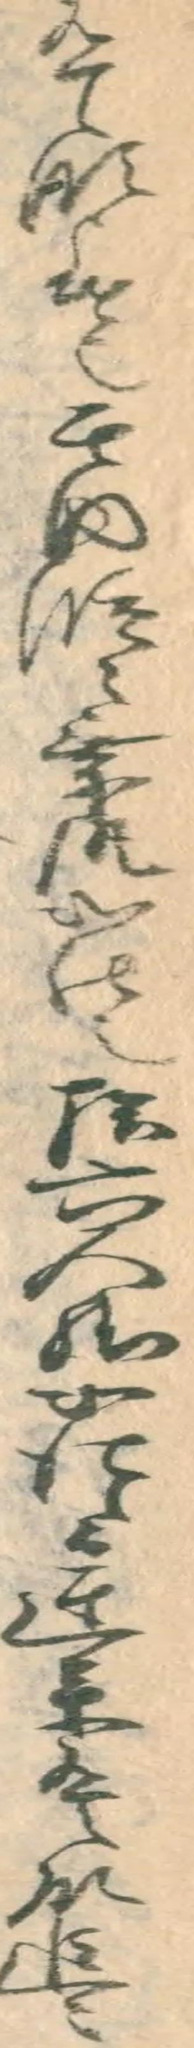有之段申遣也其内段々乗尻出仕也拾六人様出仕候而達参有之故追々
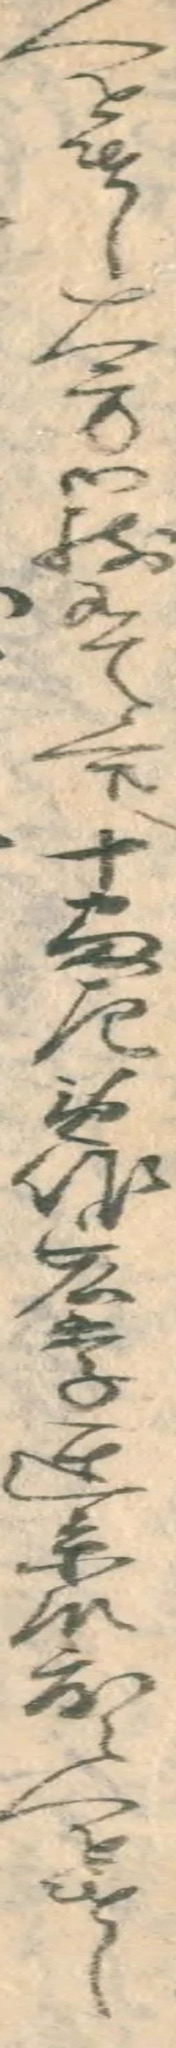人を遣し大方御揃有之候へ共十番左美作宏季遅参故度々人を遣し
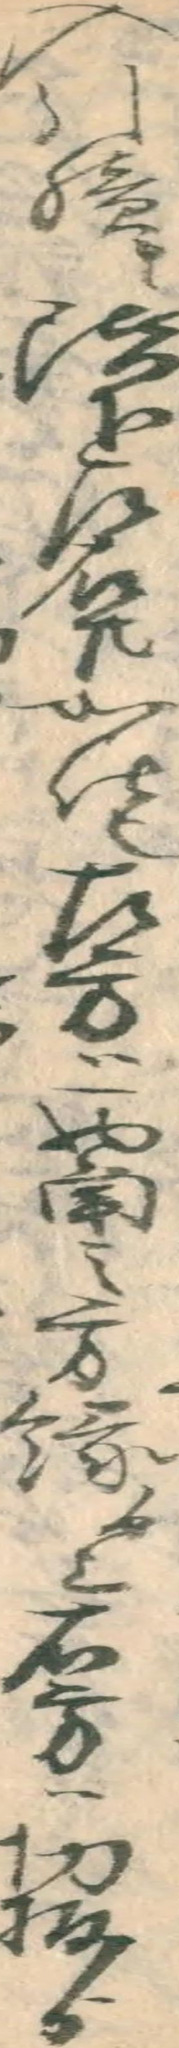入引続キ階下左右共出仕也左方ハ西南之方縁ゟ上右方ハ切板ゟ
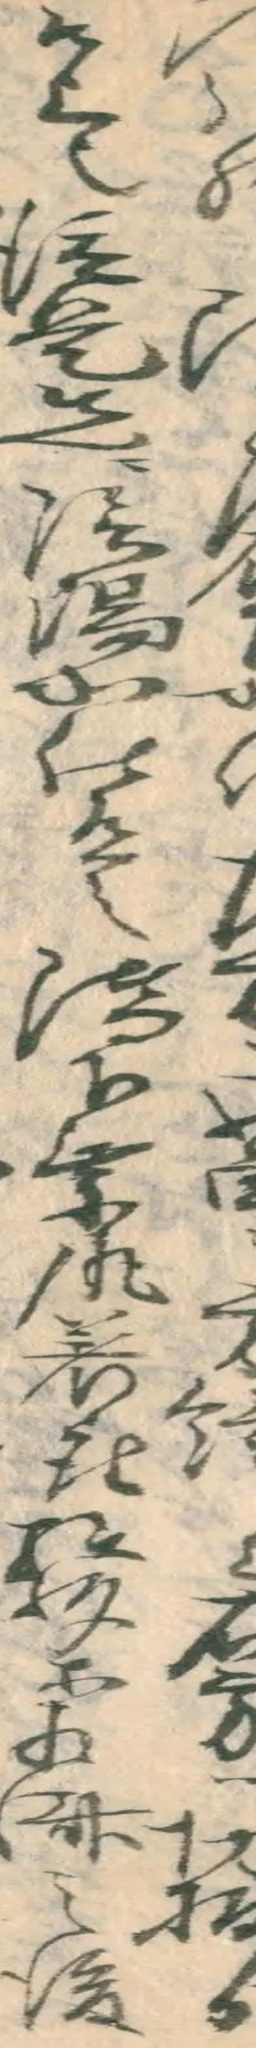被上也従是先ニ陰陽出仕有之階下乗尻着座挨拶等相済之後
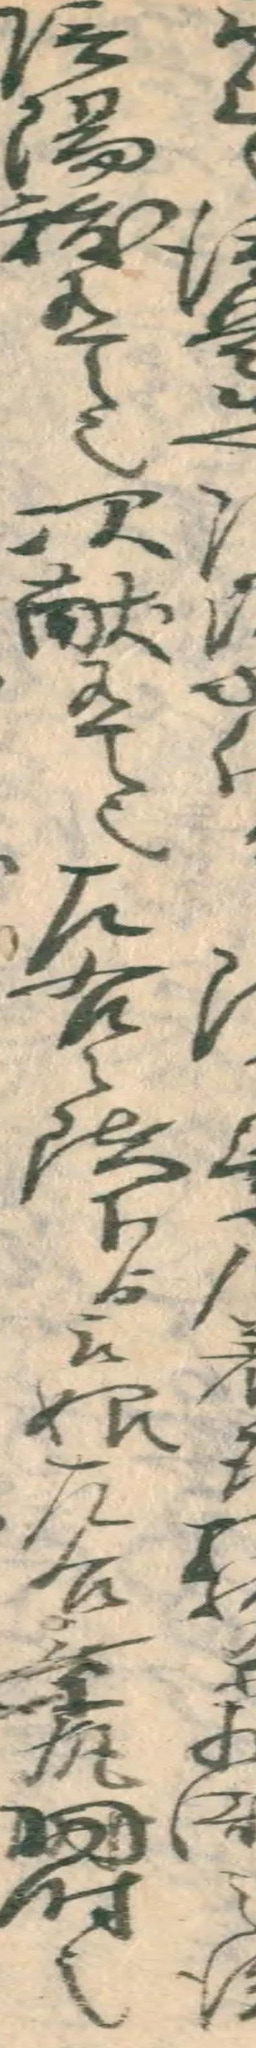陰陽祓有之也次献有之也左右之階下ゟ被始左右乗尻同時也
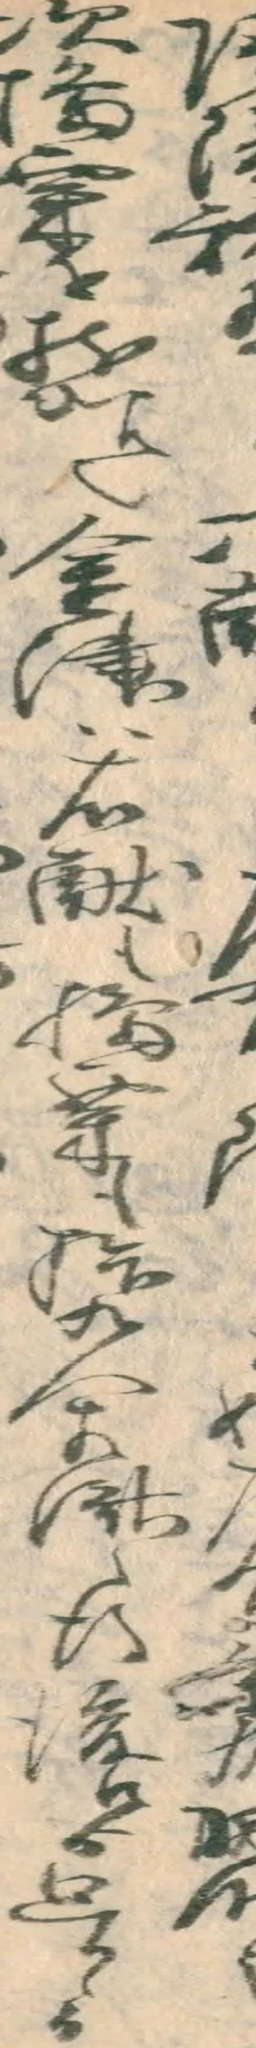次搗栗を持出ル也金津ハ右献も搗栗も拾九人相済候後後ロゟ廻り候而
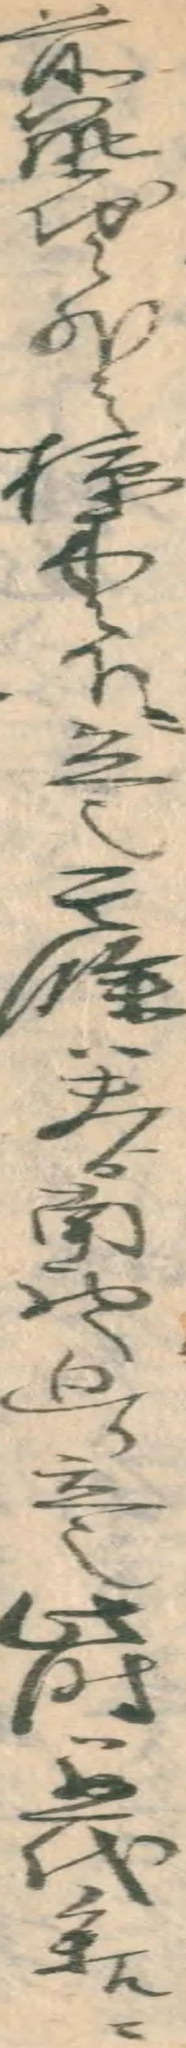前築地之外之椋木之下ニ立也其余ハ夫ゟ南西へ廻り立也此時ハ惣代参ルニ
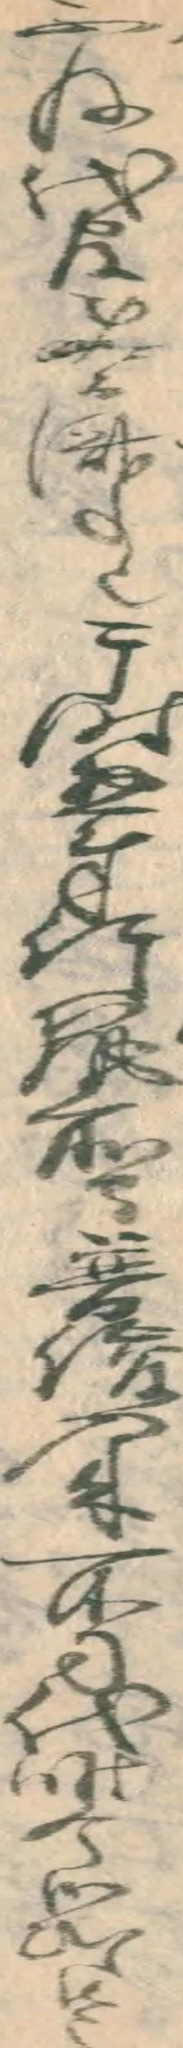不及代官計ニ而済事也于時惣奉行筑前守普俊入来所司代唯今御出候由也
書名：賀茂社記録. 第58冊
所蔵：国立国会図書館 National Diet Library, JAPAN
